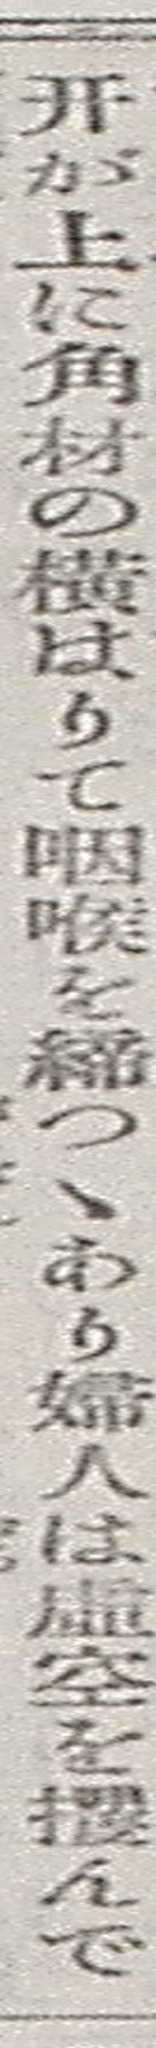幵が上に角材の横はりて咽喉を締つゝあり婦人は虚空を攫んで
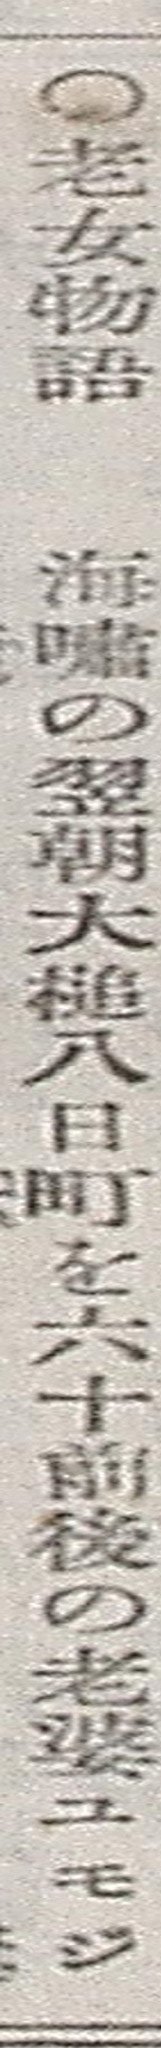○老女物語海嘯の翌朝大槌八日町を六十前後の老婆ユモジ
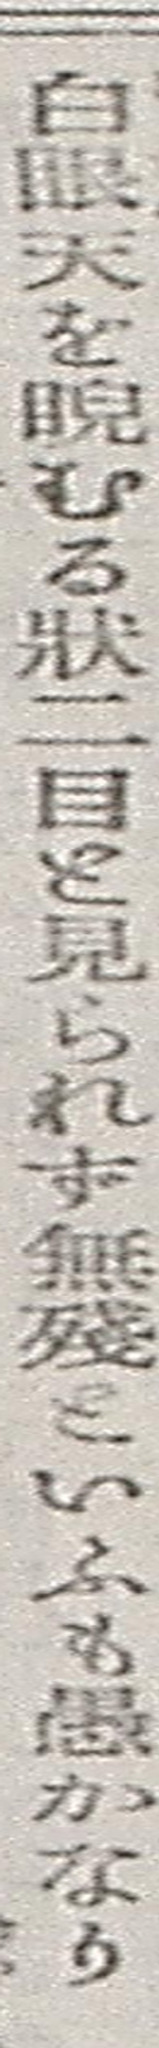白眼天を睨むる状二目と見られず無残といふも愚かなり
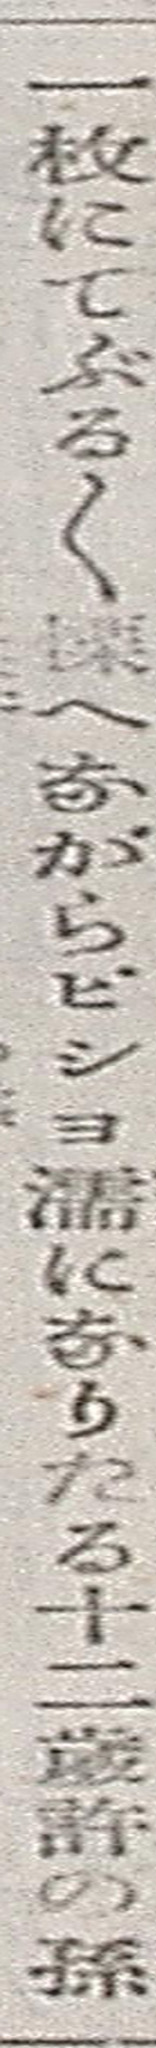一枚にてぶる〳〵慄へながらビショ濡になりたる十二歳許の孫
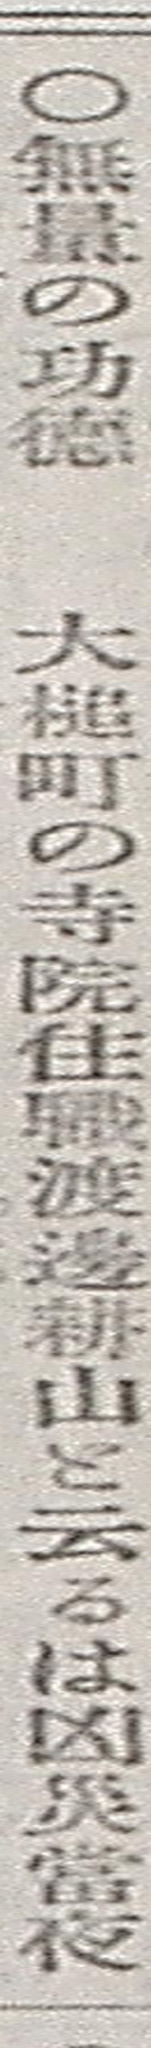○無量の功徳大槌町の寺院住職渡邊耕山と云るは凶災当夜
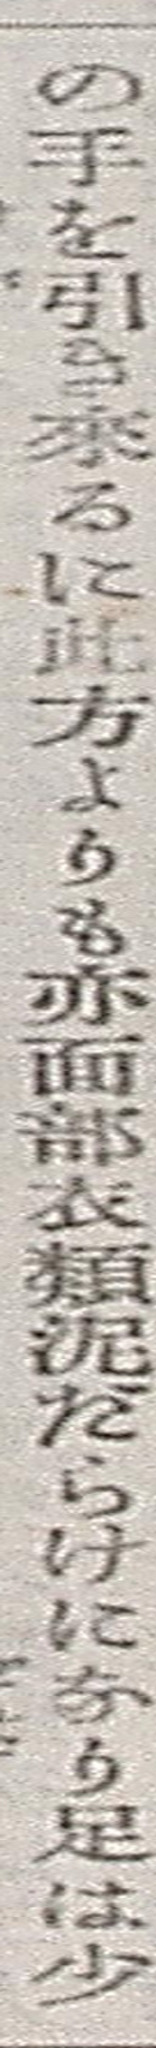の手を引き来るに此方よりも亦面部衣類泥だらけになり足は少
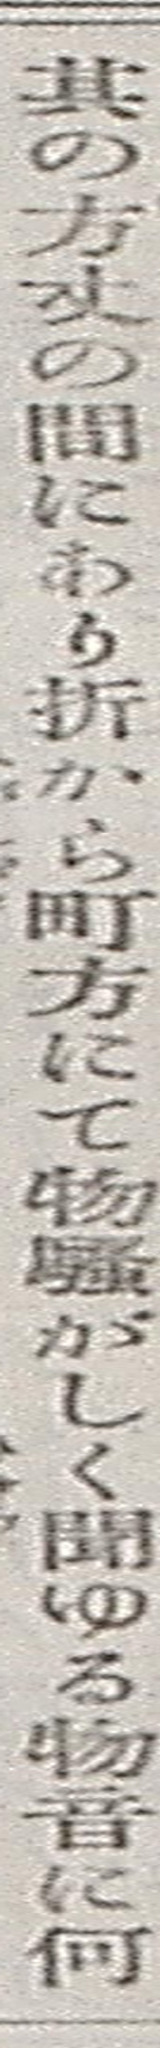其の方丈の間にあり折から町方にて物騒がしく聞ゆる物音に何
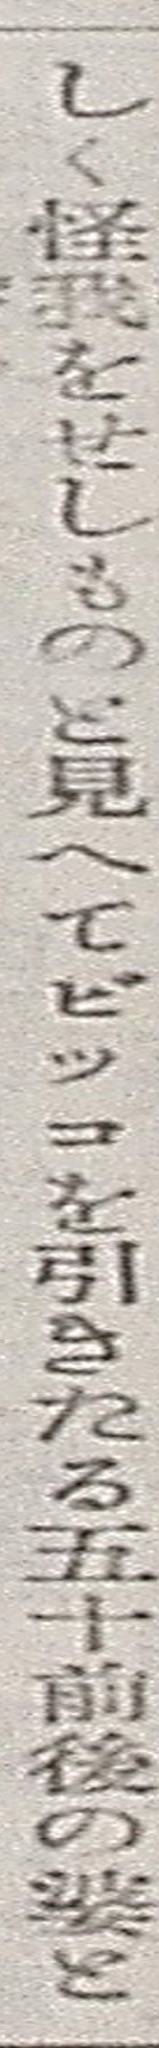しく怪我をせしものと見へてビッコを引きたる五十前後の婆と
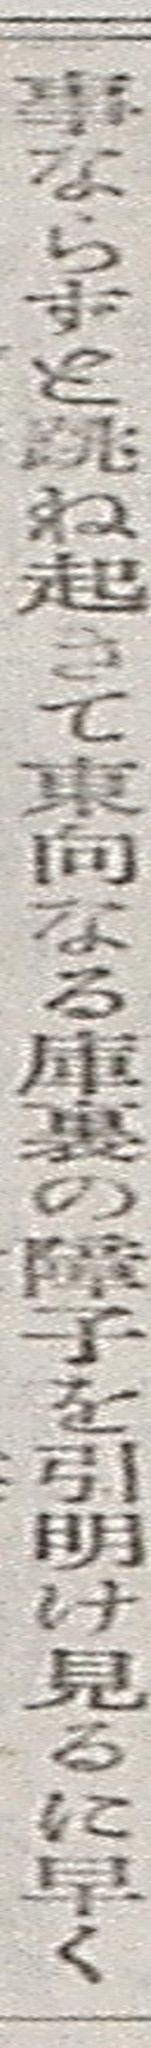事ならずと跳ね起きて東向なる庫裏の障子を引明け見るに早く
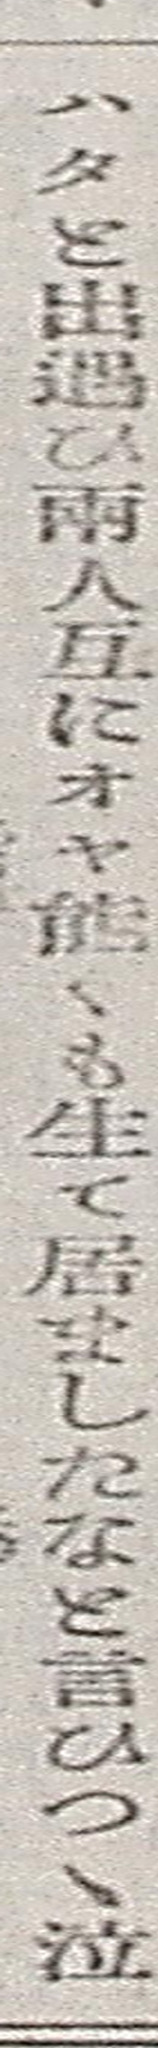ハタと出遇ひ両人互にオヤ能くも生て居ましたなと言ひつゝ泣
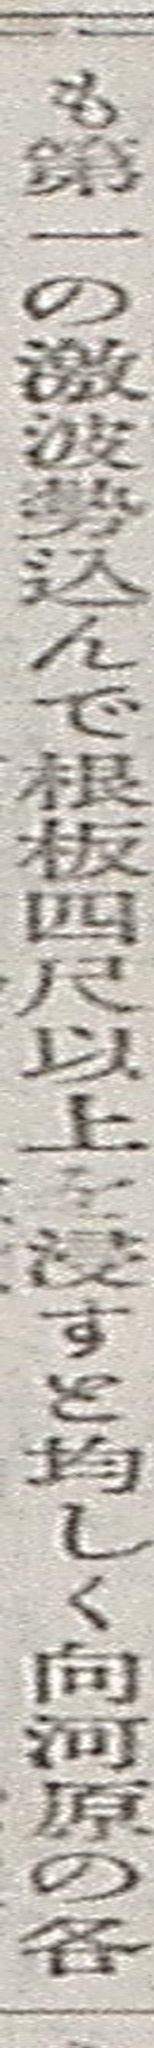も第一の激波勢込んで根板四尺以上を浸すと均しく向河原の各
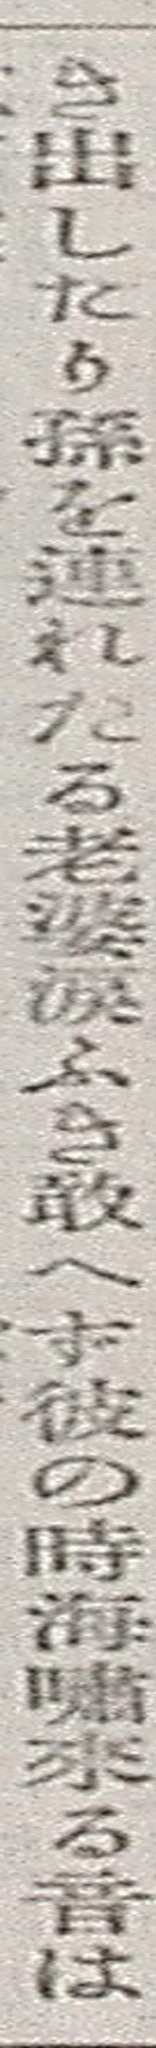き出したり孫を連れたる老婆涙ふき敢へず彼の時海嘯来る音は
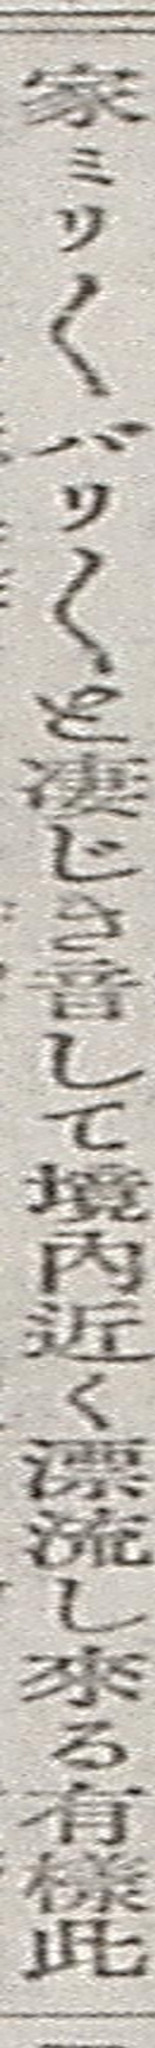家ミリ〳〵バリ〳〵と凄じき音して境内近く漂流し来る有様此
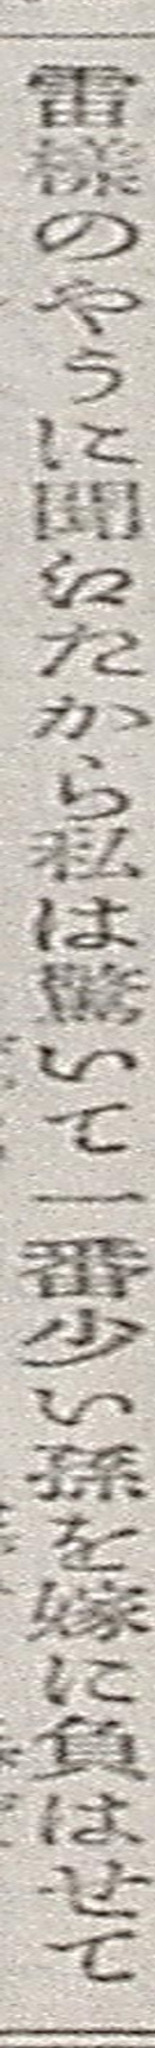雷様のやうに聞えたから私は驚いて一番少い孫を嫁に負はせて
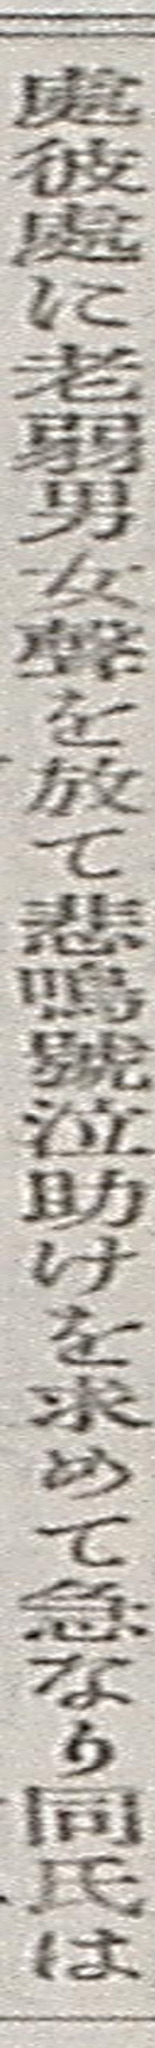処彼処に老弱男女声を放て悲鳴号泣助けを求めて急なり同氏は
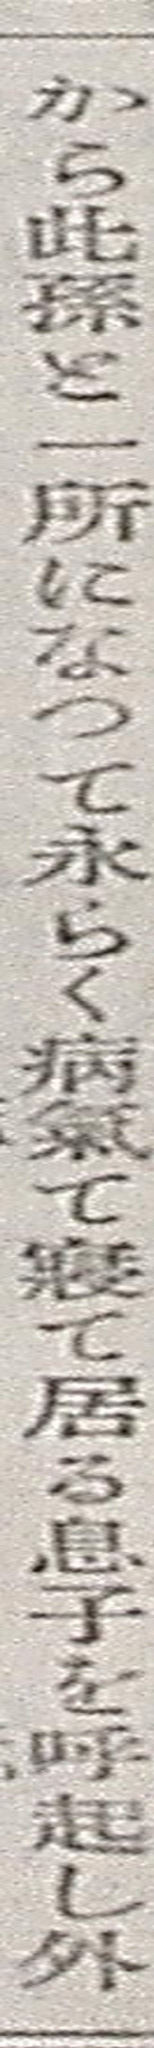から此孫と一所になつて永らく病気て寝て居る息子を呼起し外
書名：風俗畫報臨時増刊第百二十號　大海嘯被害録（下）
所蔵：東京大学地震研究所図書室 Earthquake Research Institute Library, The University of Tokyo, JAPAN
